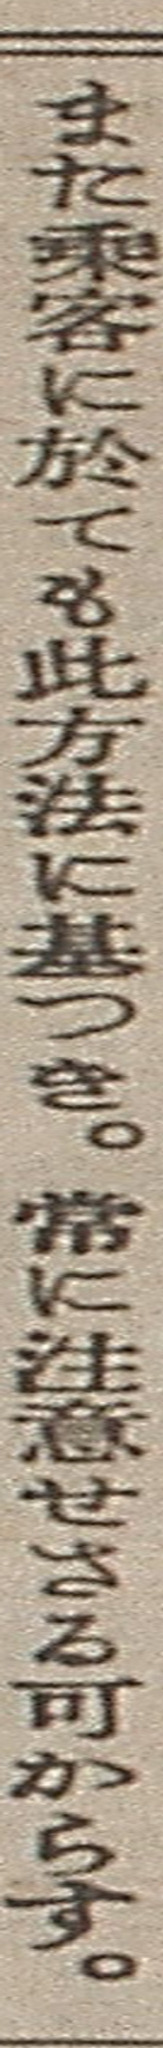また乗客に於ても此方法に基つき。常に注意せさる可からす。
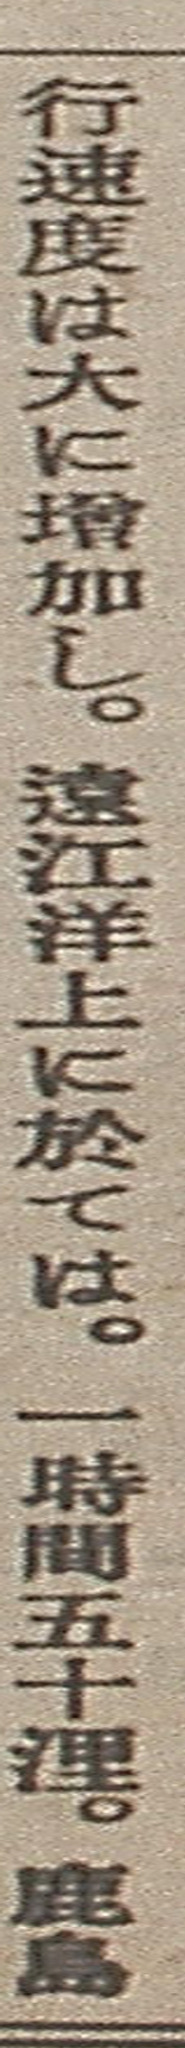行速度は大に増加し。遠江洋上に於ては。一時間五十浬。鹿島
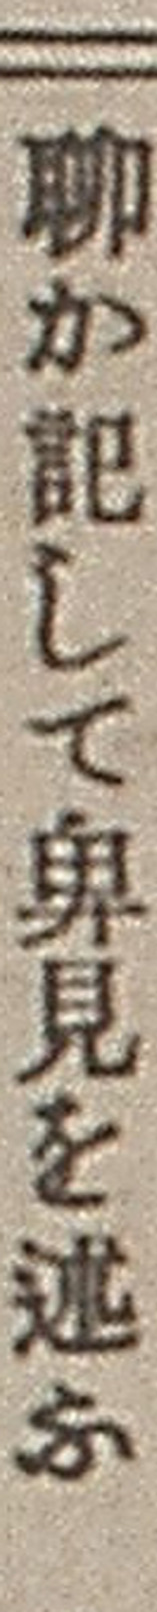聊か記して卑見を述ふ
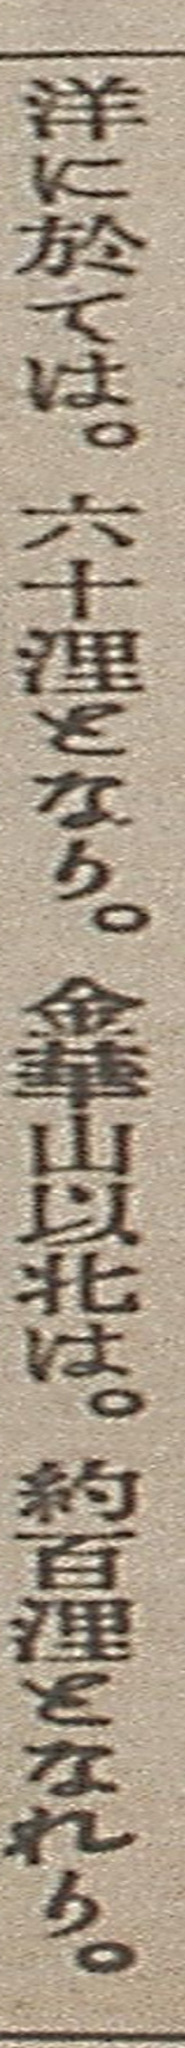洋に於ては。六十浬となり。金華山以北は。約百浬となれり。
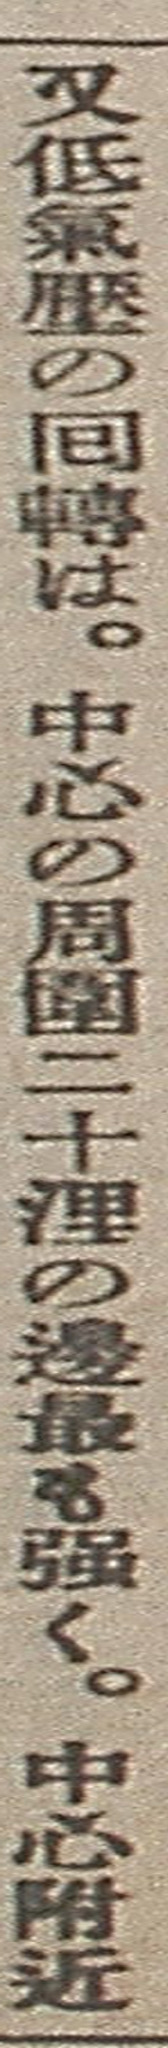又低気圧の回転は。中心の周囲二十浬の辺最も強く。中心附近
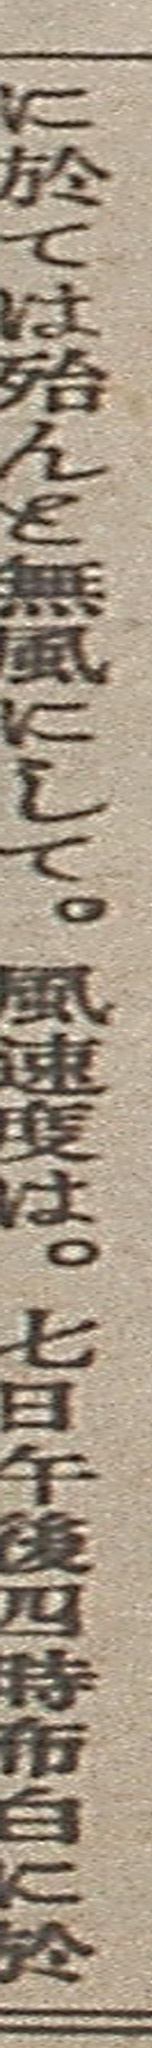に於ては殆んと無風にして。風速度は。七日午後四時布白に於
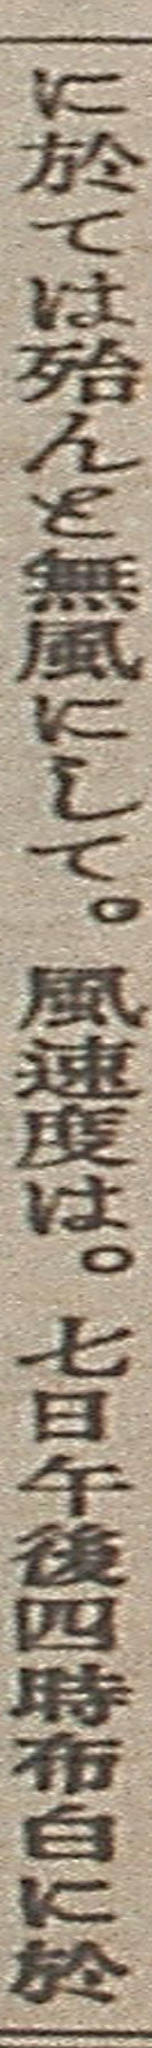に於ては殆んと無風にして。風速度は。七日午後四時布白に於
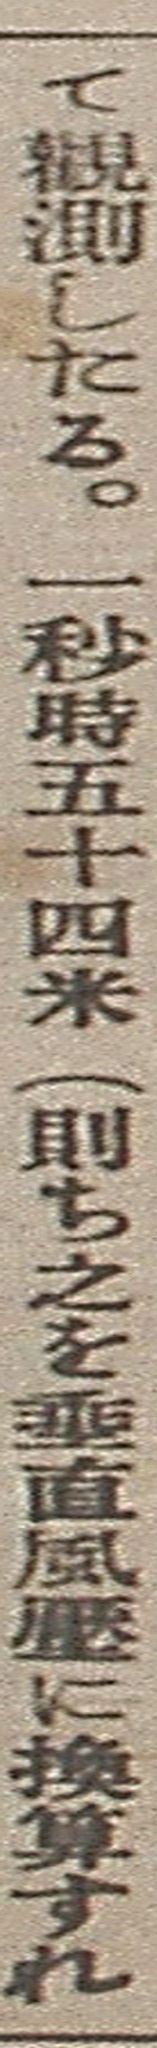て観測したる。一秒時五十四米（則ち之を垂直風圧に換算すれ
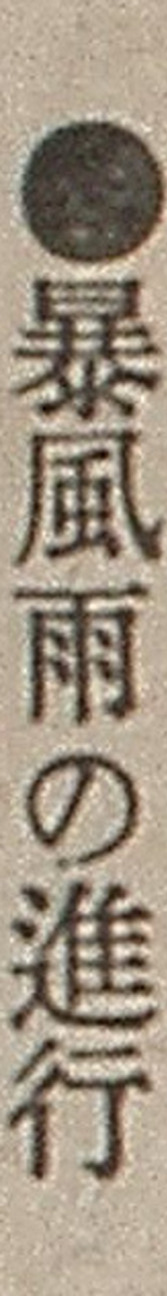●暴風雨の進行
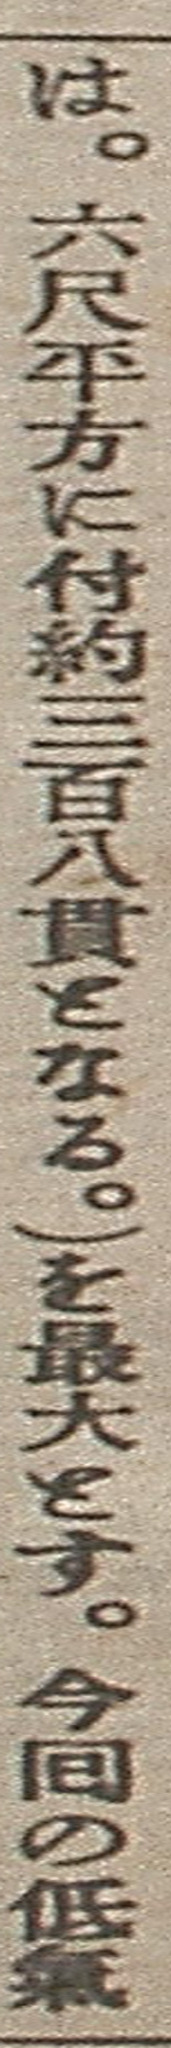は。六尺平方に付約三百八貫となる。）を最大とす。今回の低気
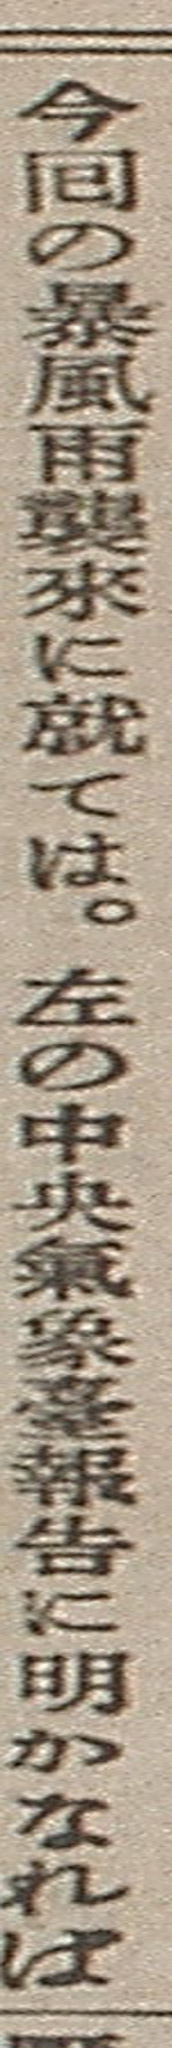今回の暴風雨襲来に就ては。左の中央気象台報告に明かなれば
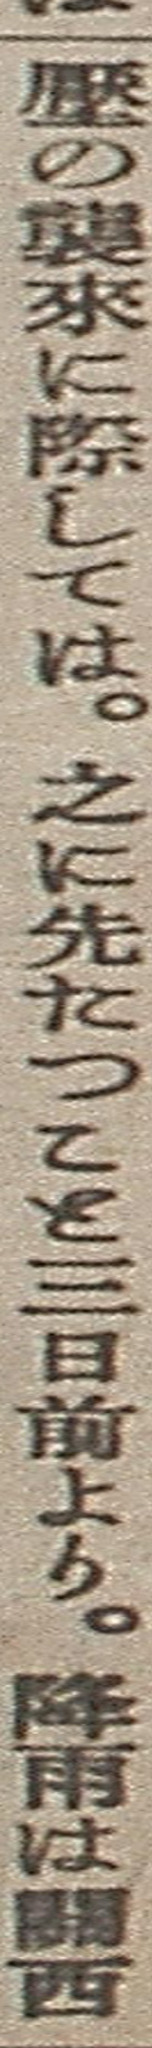圧の襲来に際しては。之に先たつこと三日前より。降雨は関西
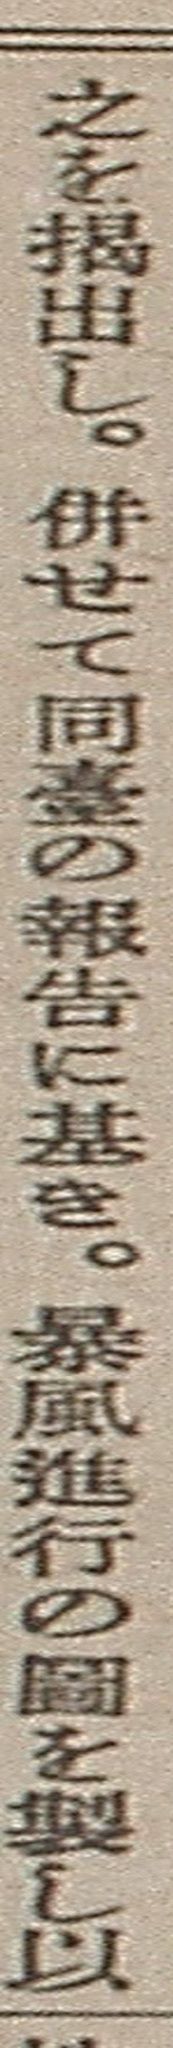之を掲出し。併せて同台の報告に基き。暴風進行の図を製し以
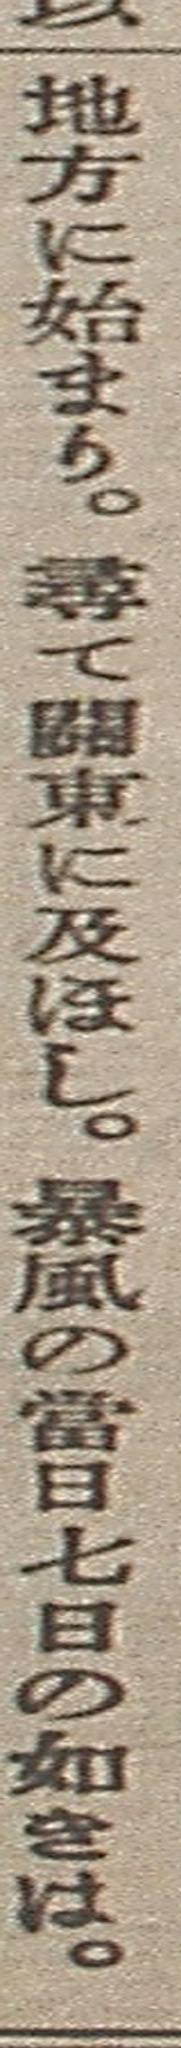地方に始まり。尋て関東に及ほし。暴風の当日七日の如きは。
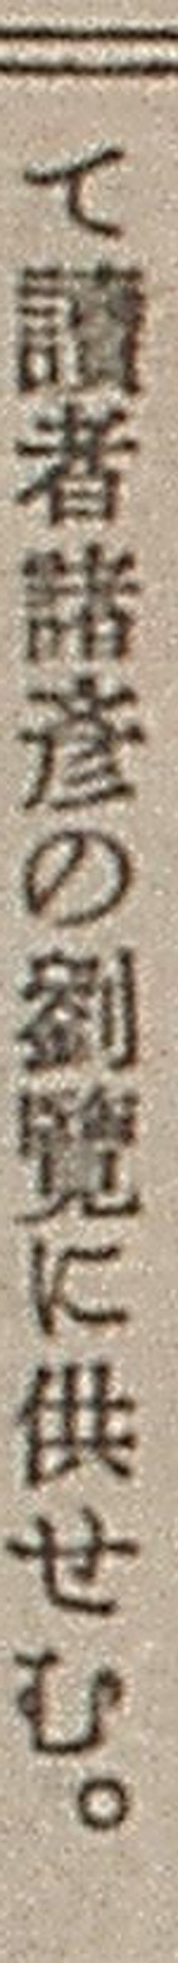て読者諸彦の劉覧に供せむ。
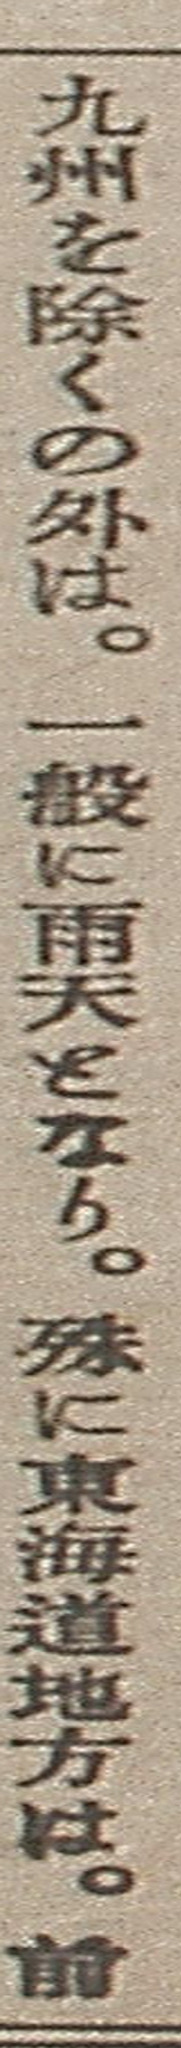九州を除くの外は。一般に雨天となり。殊に東海道地方は。前
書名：風俗畫報臨時増刊第百九十九號　明治三十二年十月各地災害圖會（前編之續）
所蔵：東京大学地震研究所図書室 Earthquake Research Institute Library, The University of Tokyo, JAPAN
